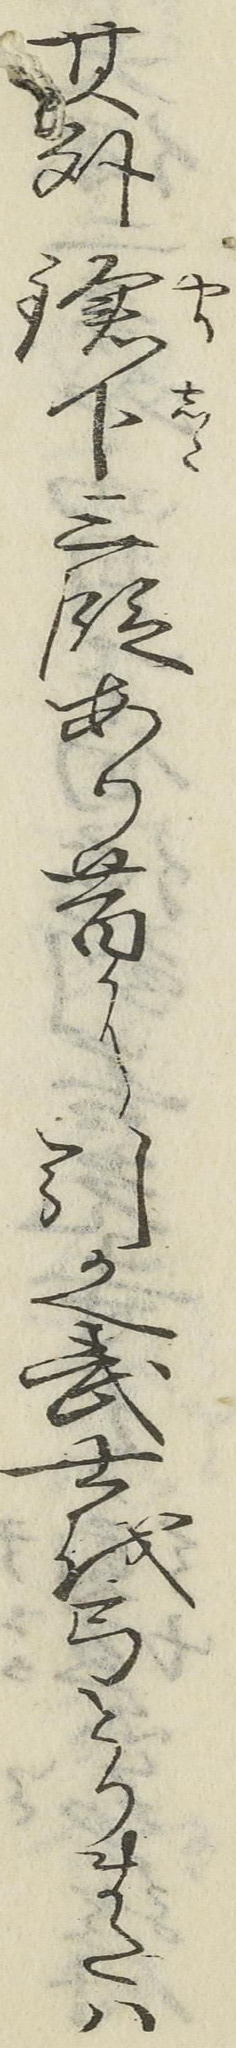其外鎗下三段ありに引かへ武士を弓とりまたは
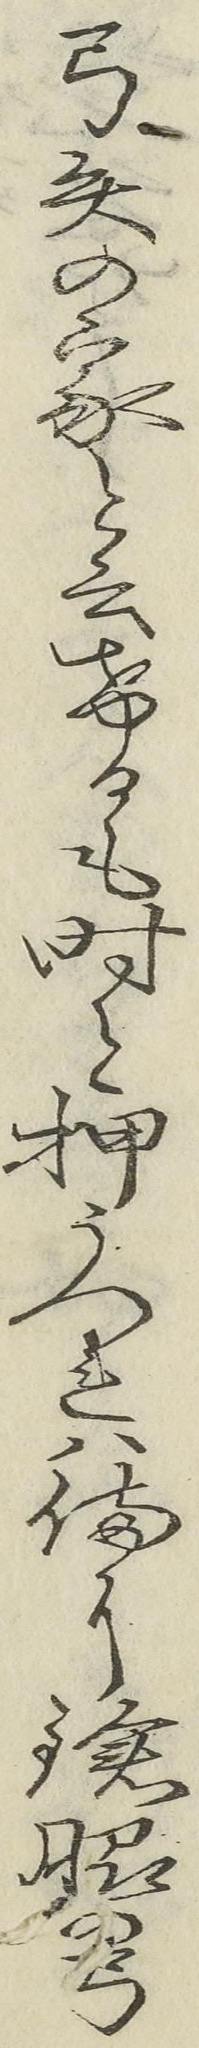弓矢の家と云けるも時と押うつれは備に鎗脇の弓
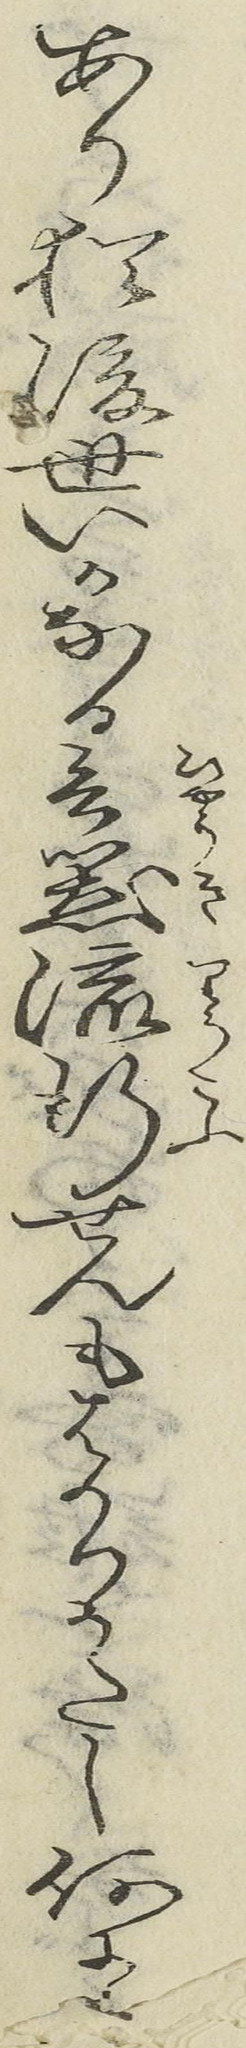あり猶渡世いかなる兵器流行せんもはかりかたし何に

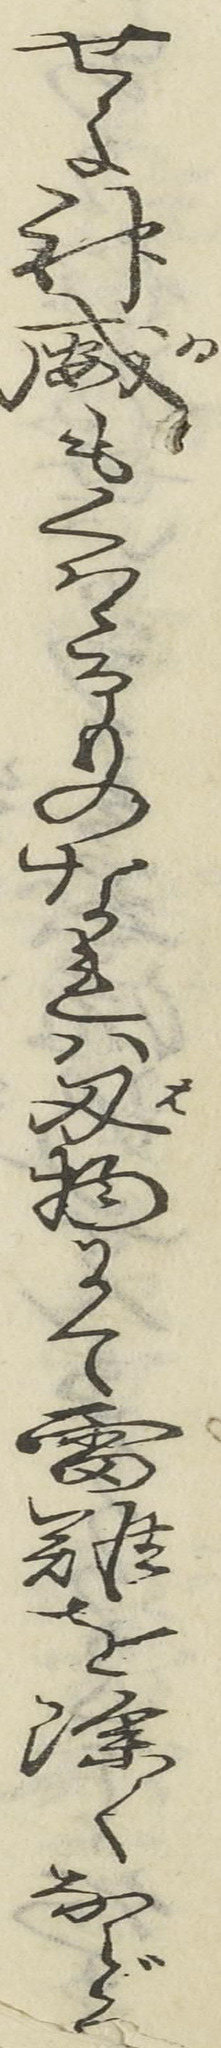せよ神威もくはゝるものなれは刃物にて雷難を除くなど
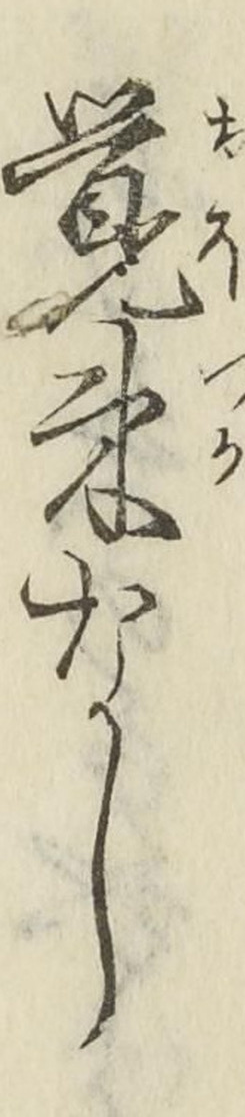覚束なし
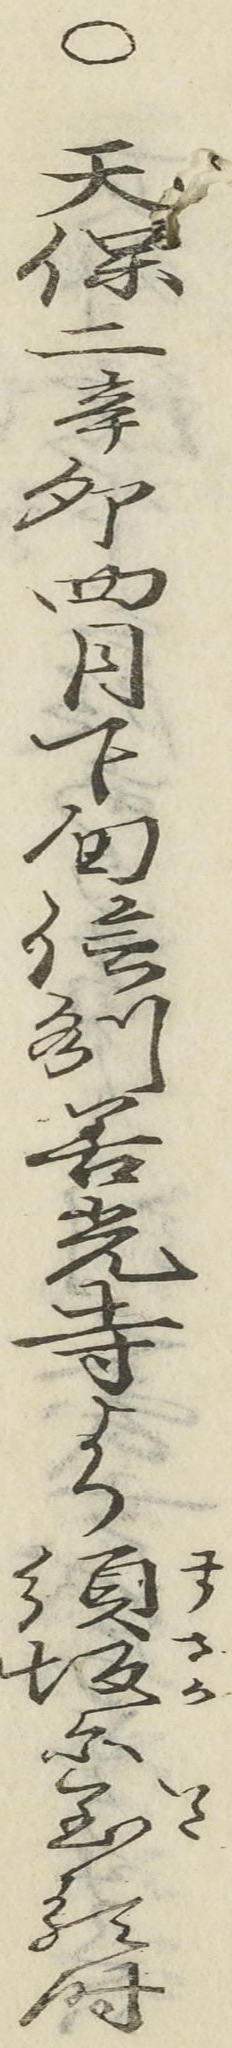〇天保二辛卯四月下旬信州善光寺より須坂に至る時
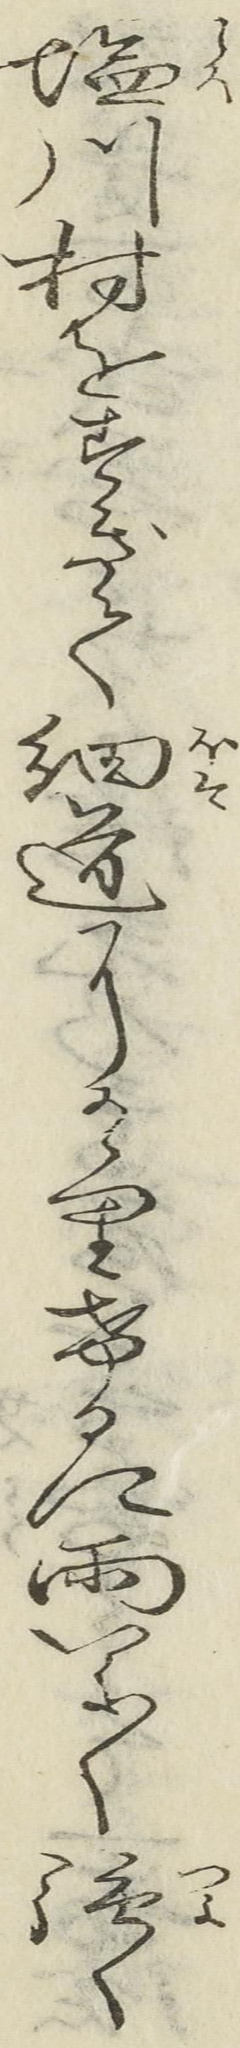塩川村をすぎて細道にかゝりけるに雨いよ〳〵強く
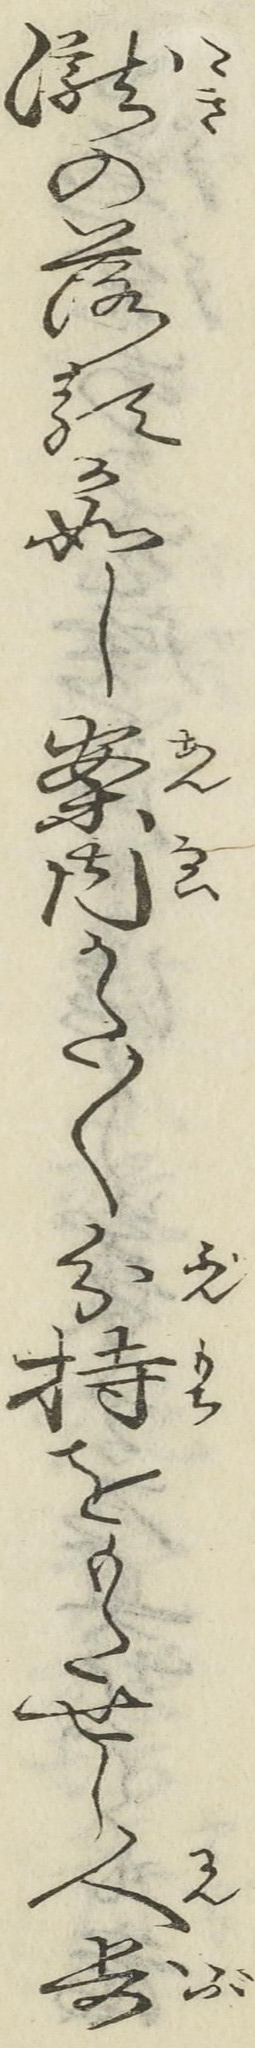瀧の落るか如し案内かた〳〵分持をもたせし人歩
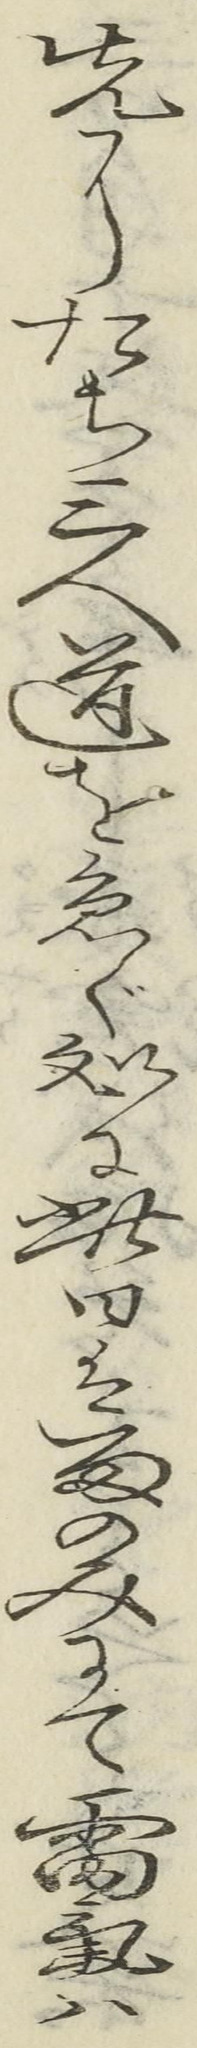先にたち三人道を急ぐ処に此日は雨のみにて雷気は
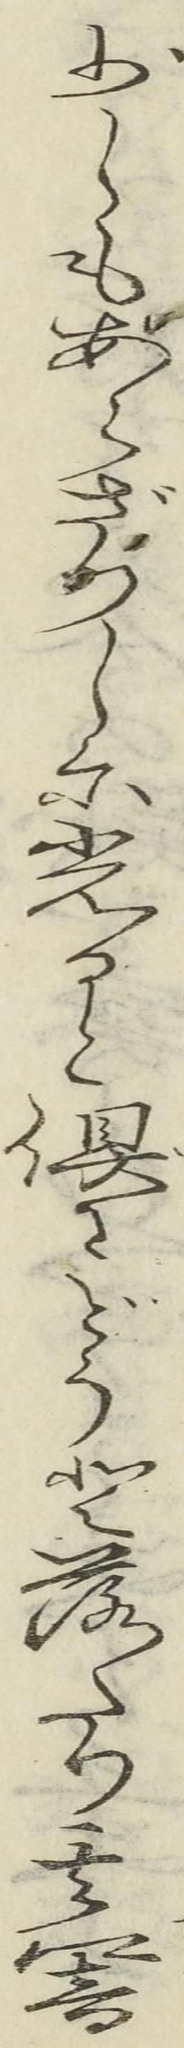少しもあらざりしに光ると倶にどうと落たり其響
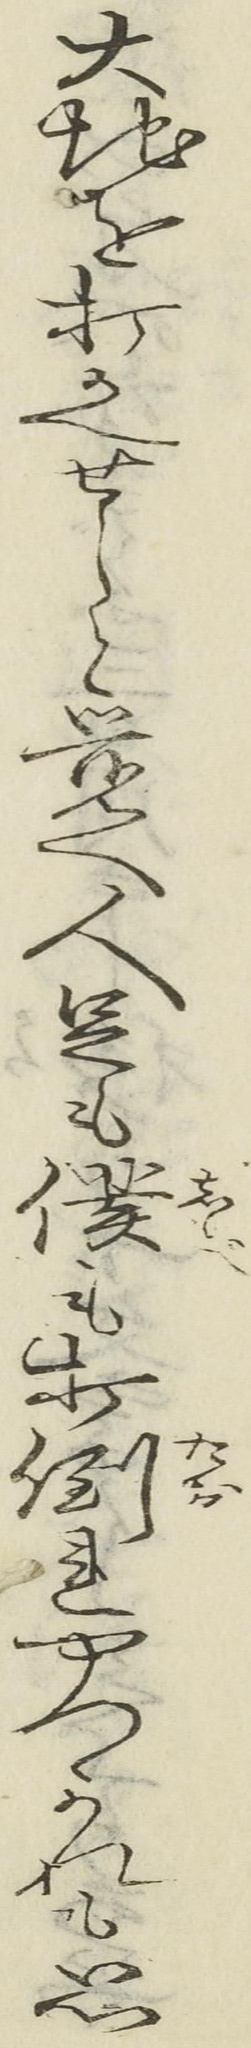大地を打ちかへせしと覚へ人足も僕も打倒れやつかれも思
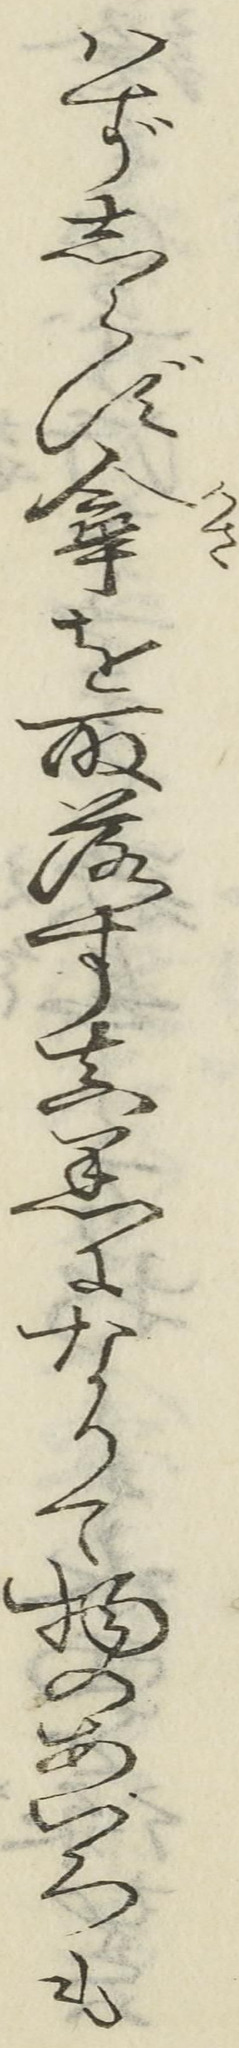はずしらず傘を取落とす真黒になりて物のあいろも
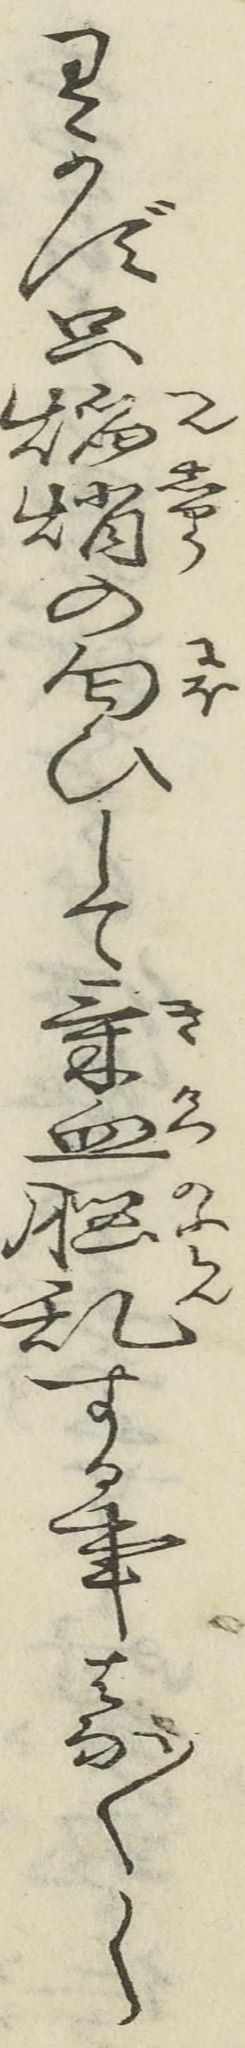わかず只焔硝の匂ひして気血脳乱する事はな〳〵し
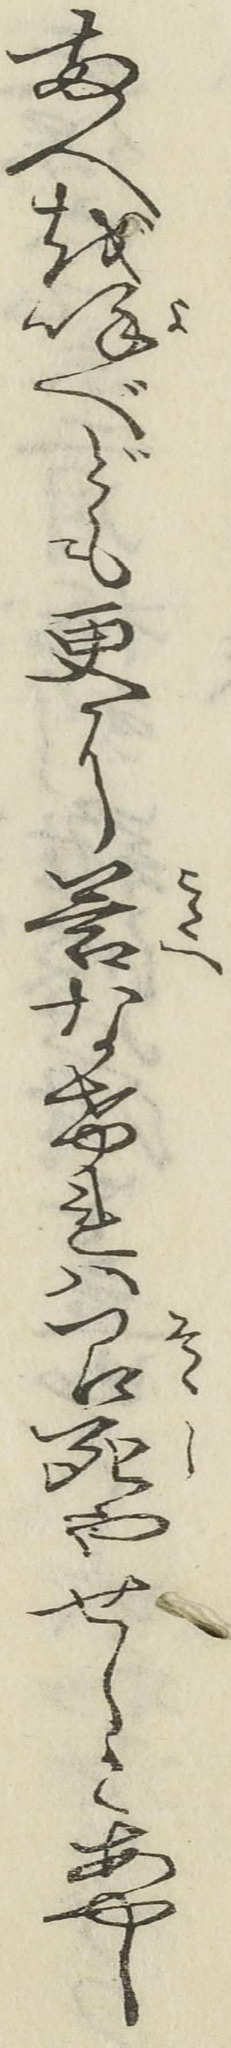両人を呼べどもさらに答なけれは即死やせしとあやし
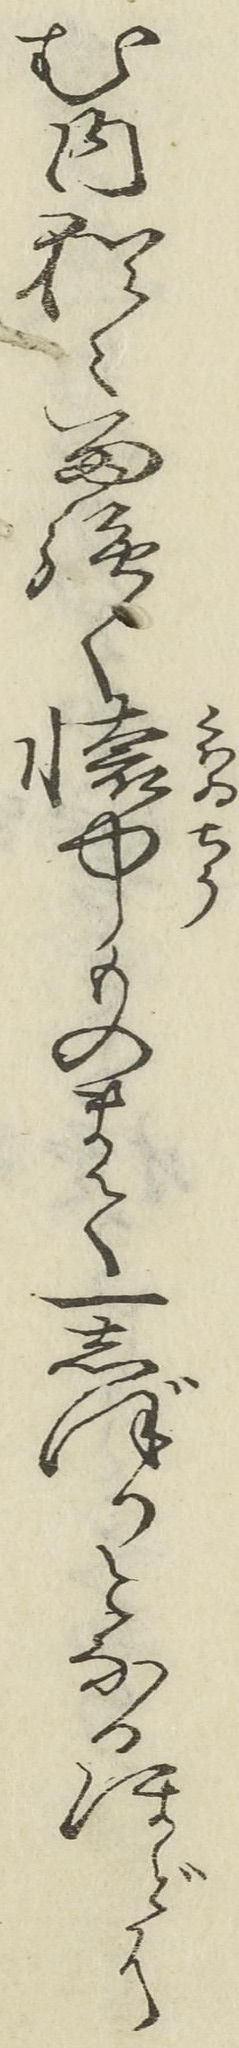む内猶々雨強く懐中ものまて一しぼりとなるほどに
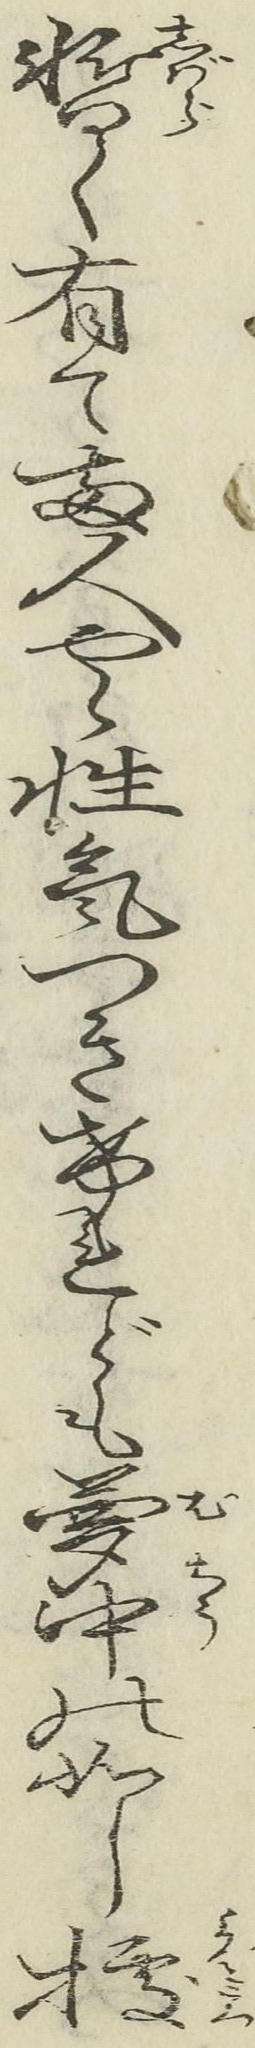暫く有て両人やゝ性気つきけれども夢中の如し拠
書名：震雷考説　全
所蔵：東京大学地震研究所図書室 Earthquake Research Institute Library, The University of Tokyo, JAPAN
